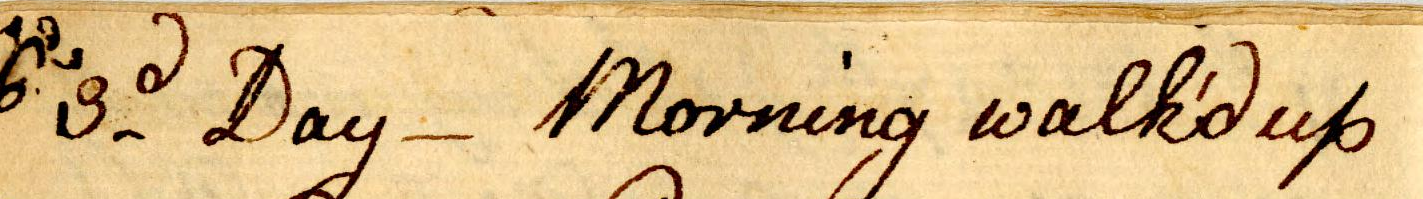3^d Day- Morning walk'd up
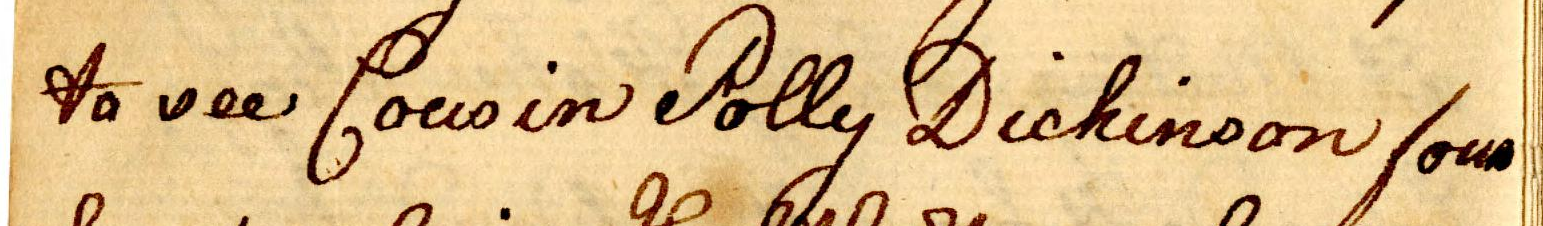to see Cousin Polly Dickinson foun
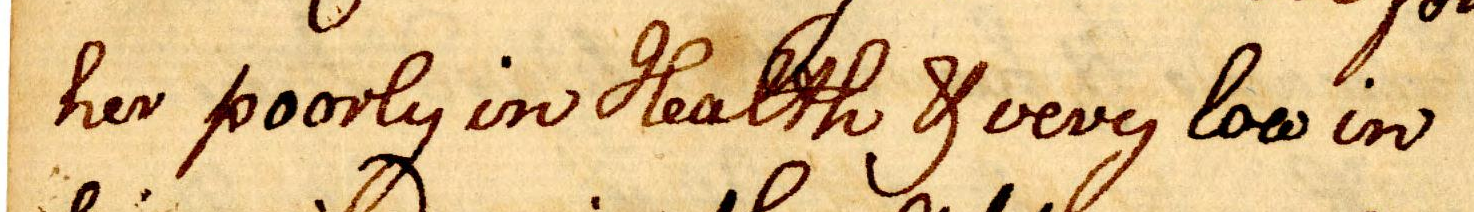her poorly in Health & very low in
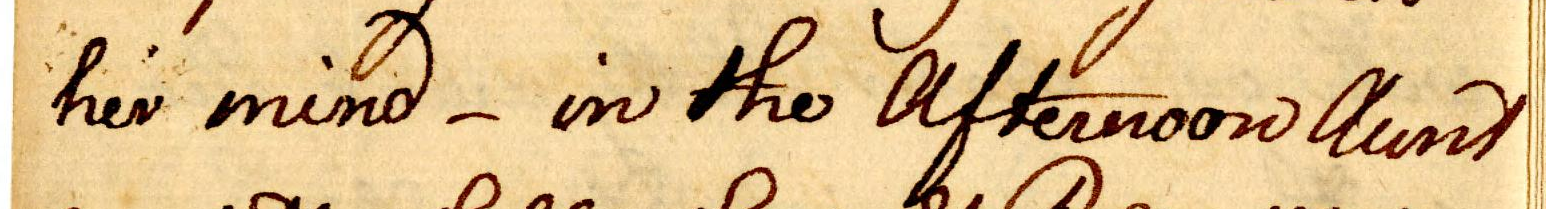her mind- in the Afternoon Aunt
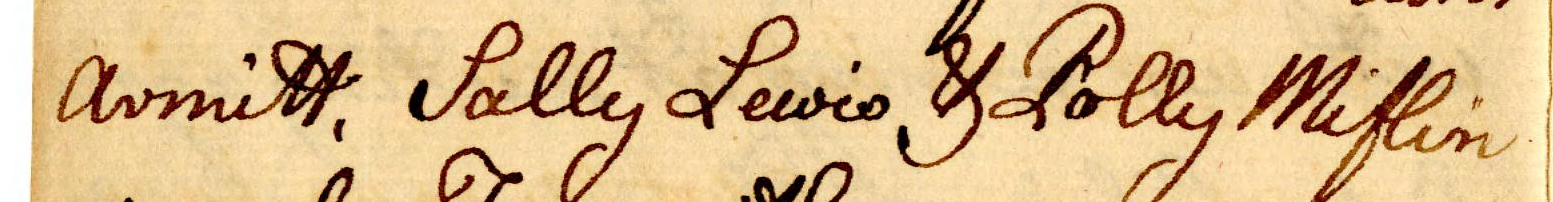Armitt, Sally Lewis & Polly Miflin
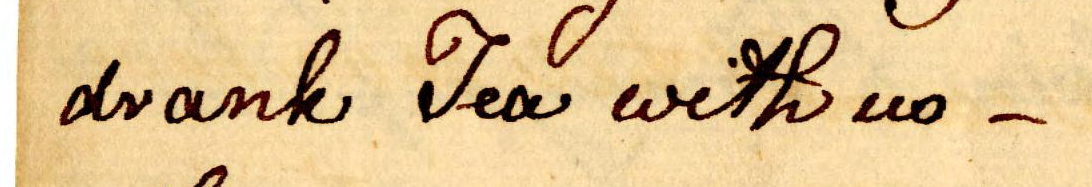drank Tea with us-
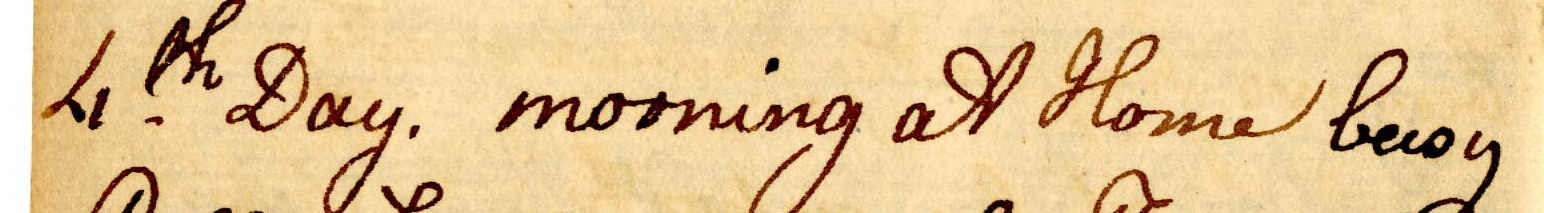4^th Day. morning at Home busy
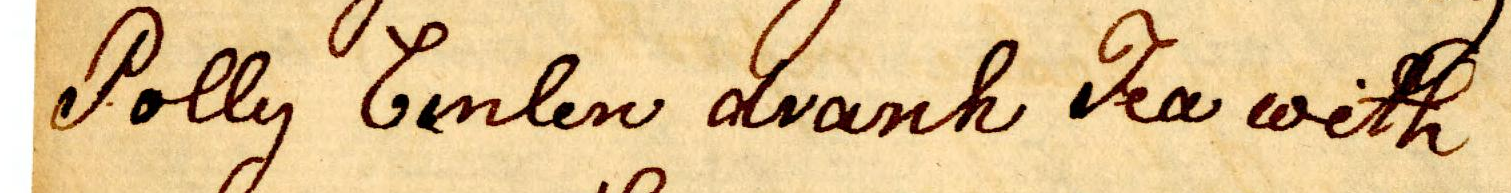Polly Emlen drank Tea with
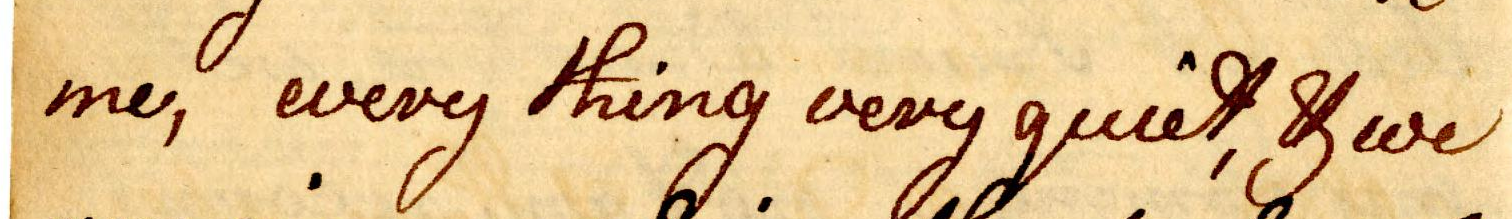me, every thing very quiet, & we
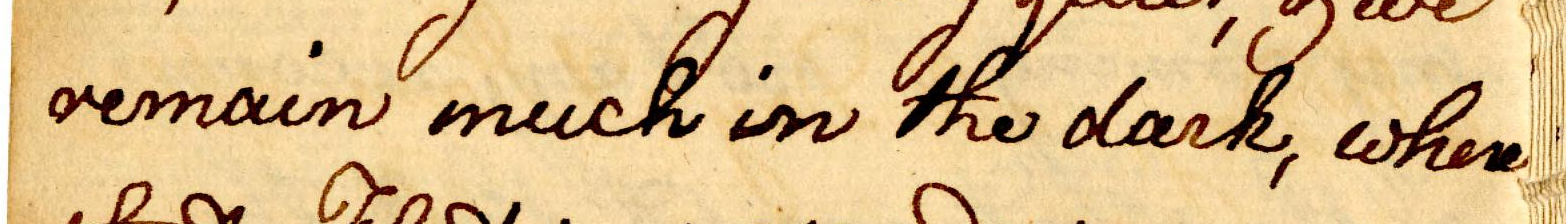remain much in the dark, where
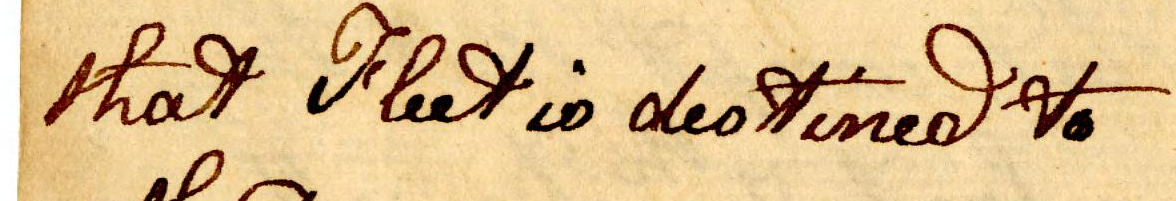that Fleet is destined to
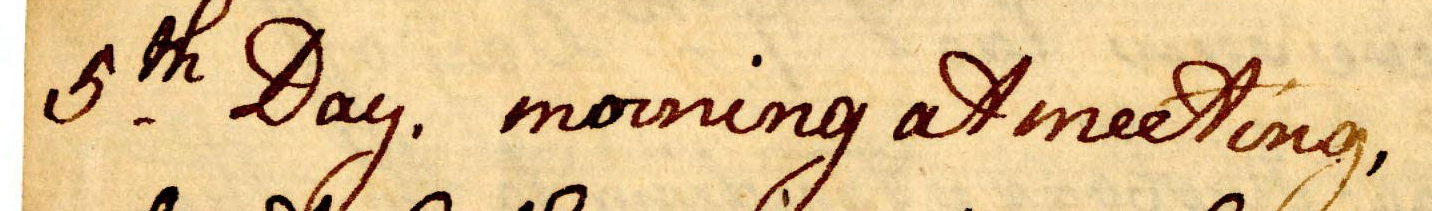5^th. Day. morning at meeting,
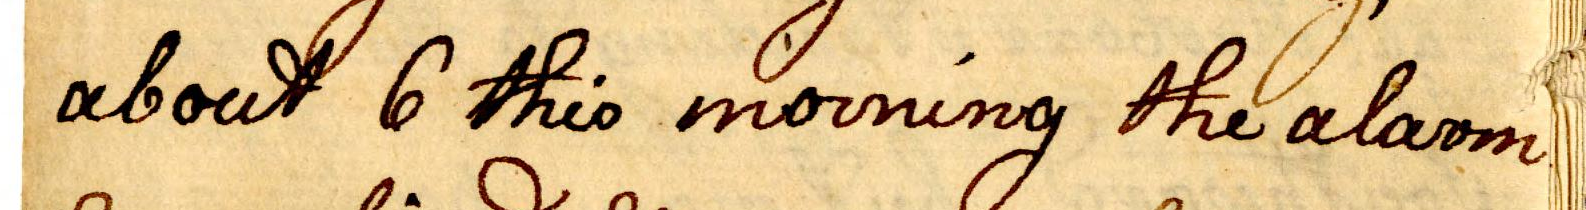about 6 this morning the alarm
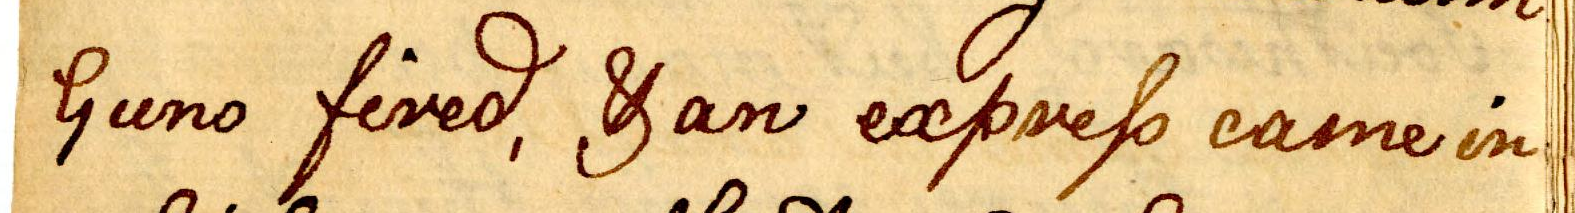Guns fired, & an express came in
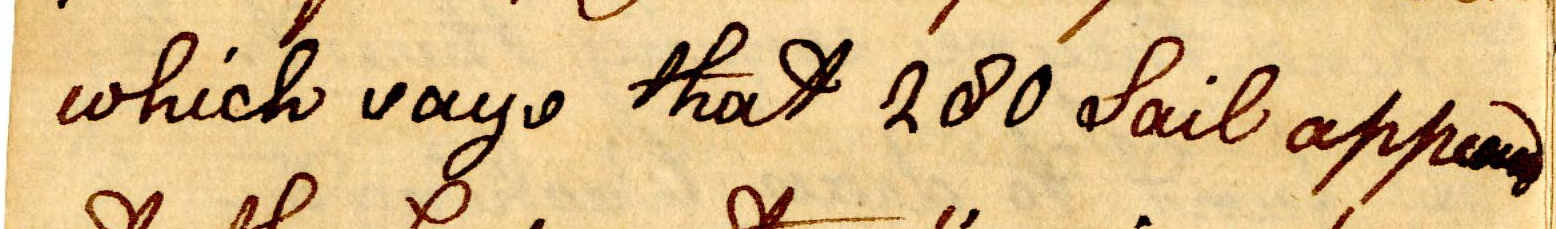which says that 280 Sail appeard
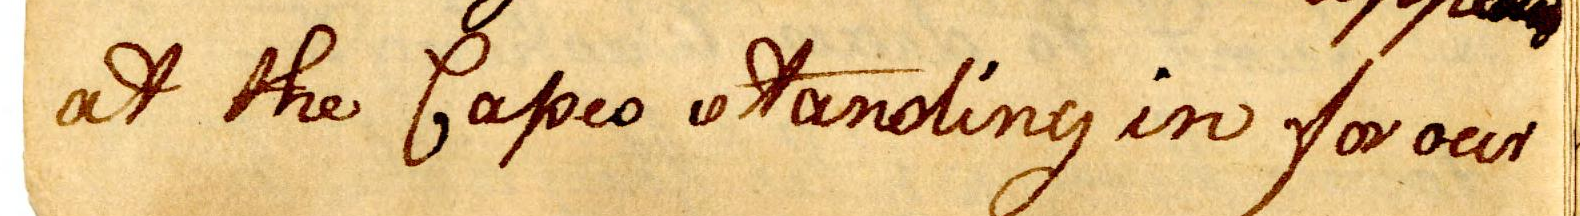at the Capes standing in for our
